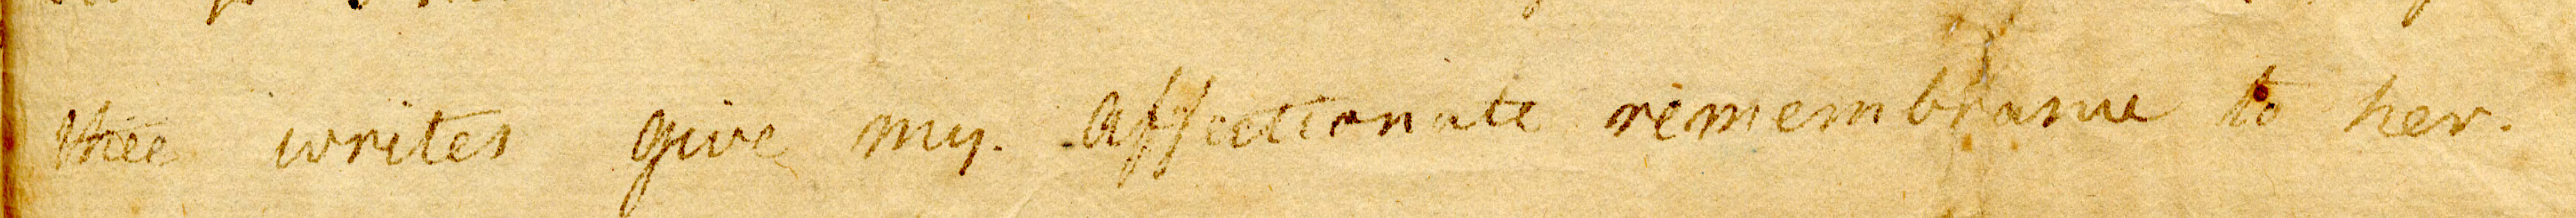thee writes give my affectionate remembrance to her
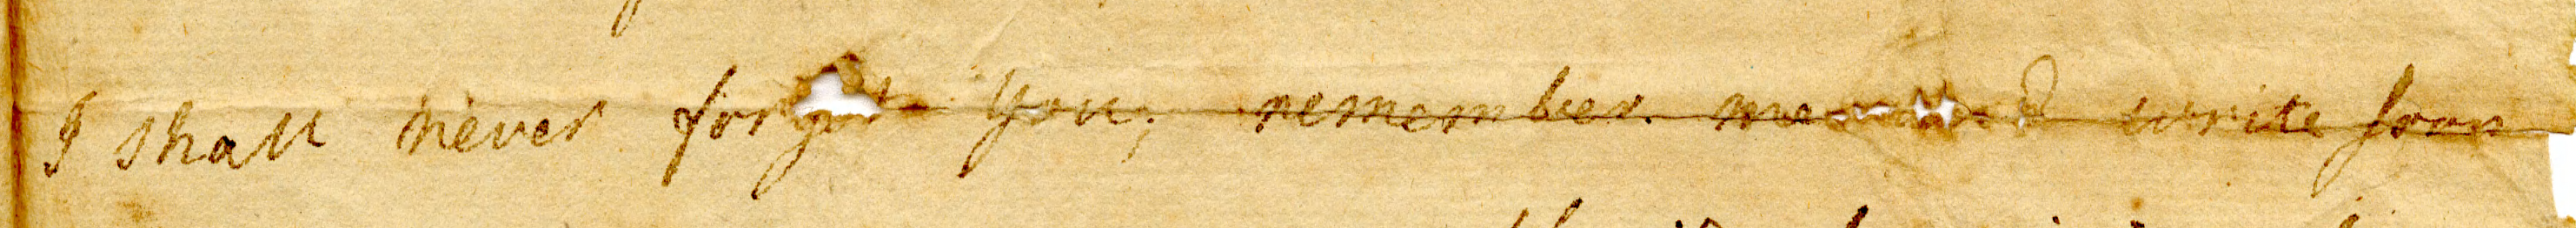I shall never forget you, remember me and write four
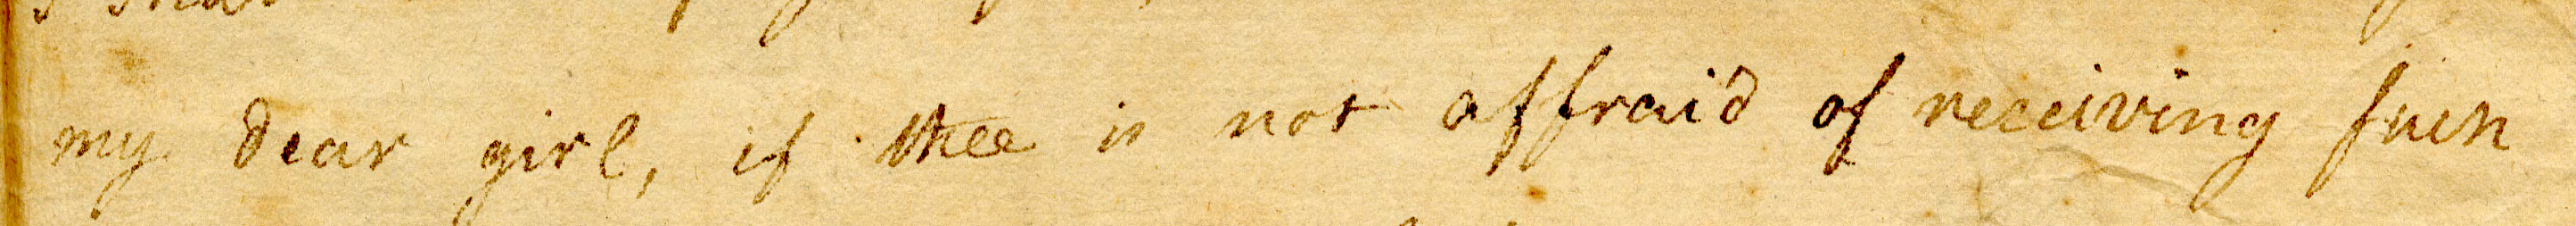my dear girl, if thee is not affraid of receiving such
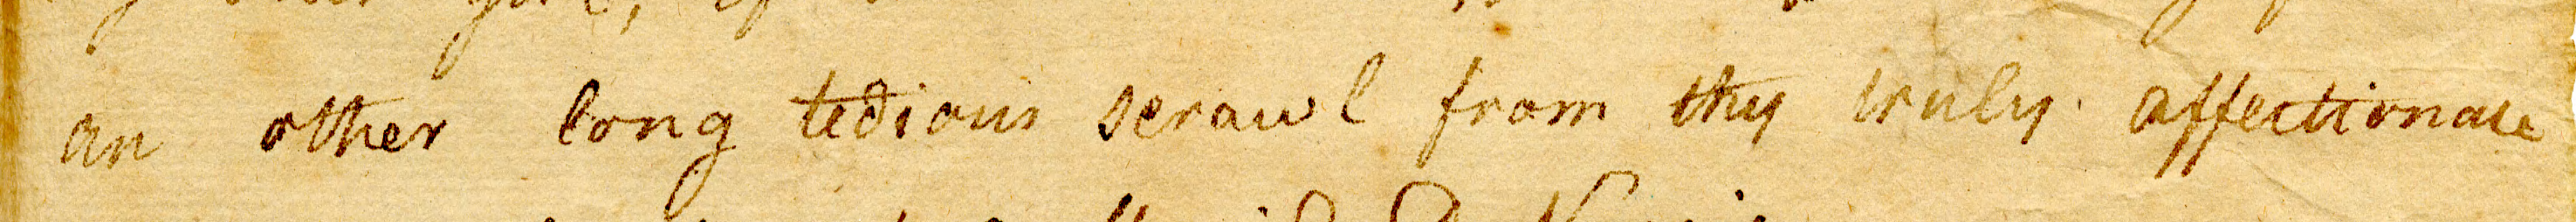an other long tedious scrawl from thy truly affectionate
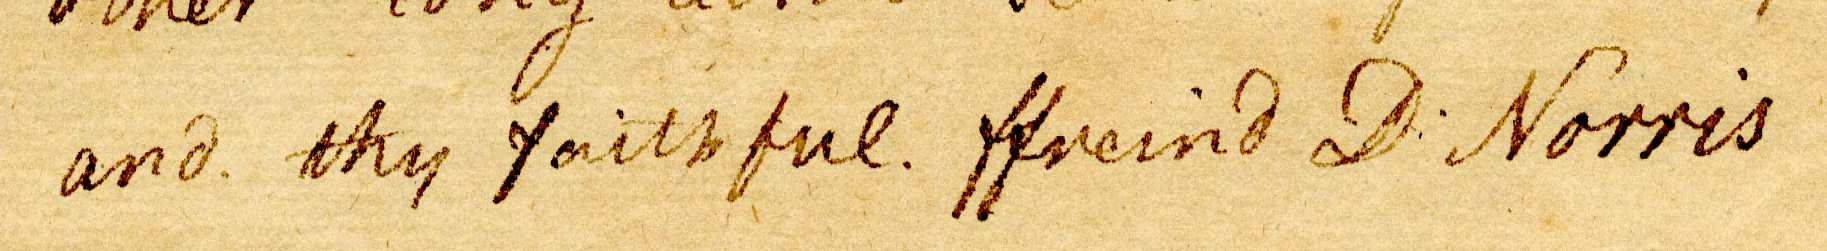and thy faithful ffriend D Norris
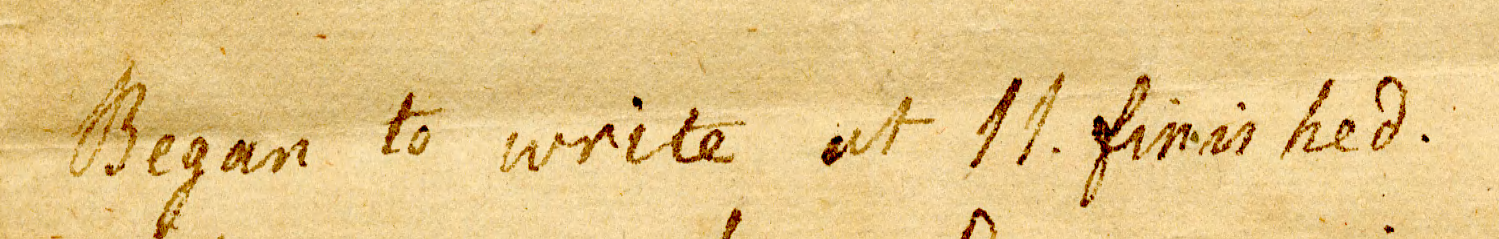Began to write at 11. finished
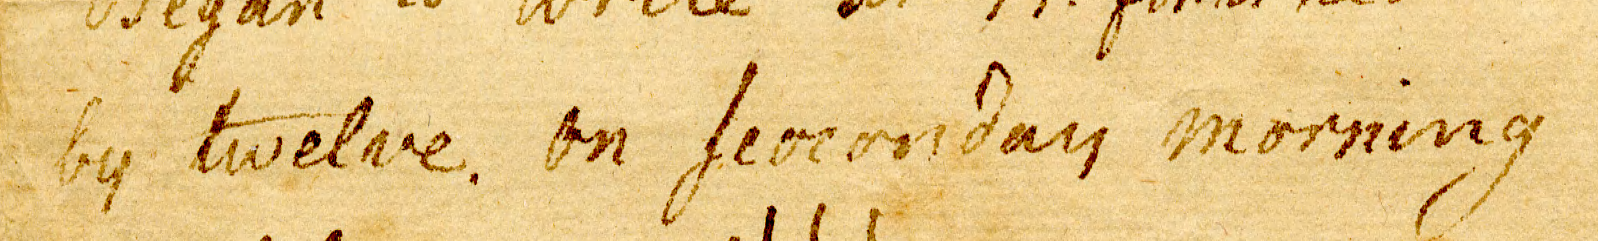by twelve. on seconday morning
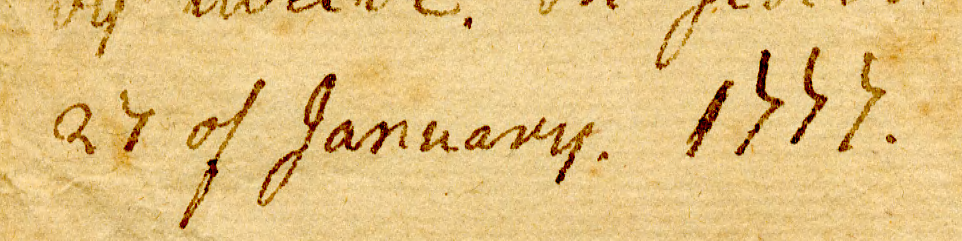27 of January. 1777.
